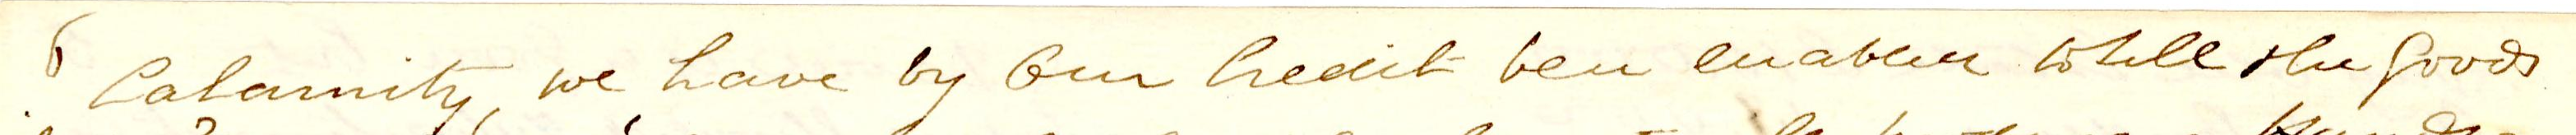Calamity, we have by Our Credit ben enabled to sell the Goods
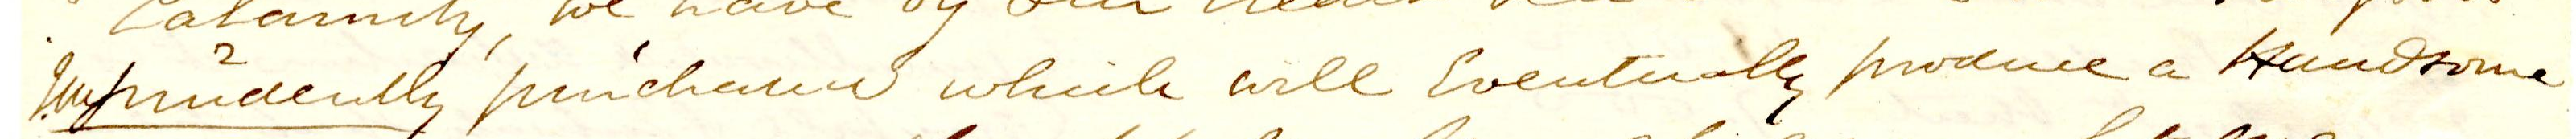Imprudently purchased which will Eventually procure a handsome
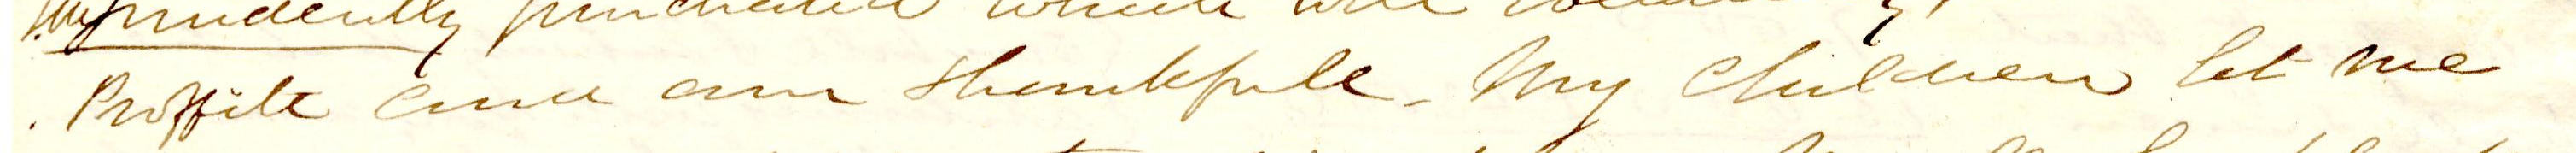Proffitt and am thankfull, my Children let me
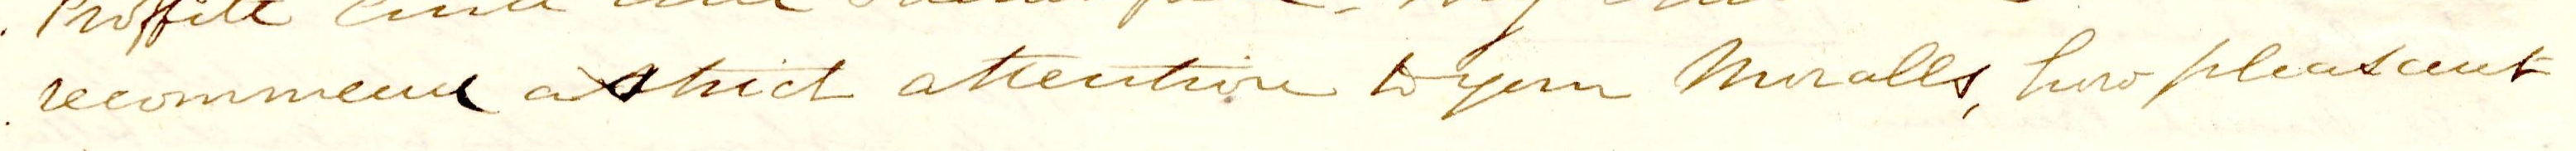recommend a strict attention to your muralls, how pleasant
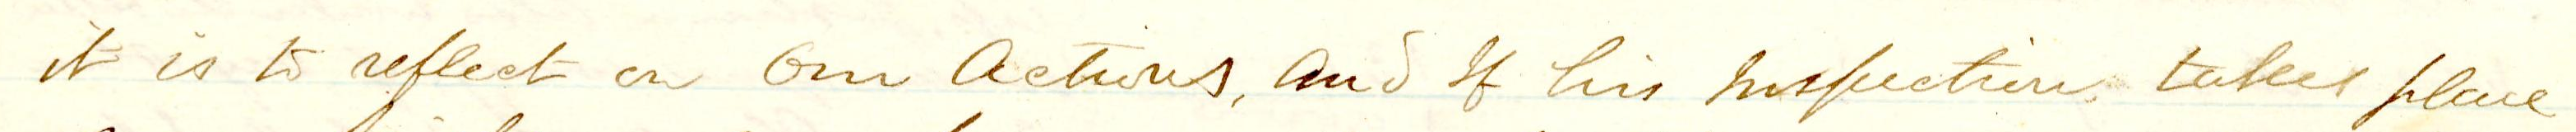it is to reflect on our Actions, and If his reflection takes place
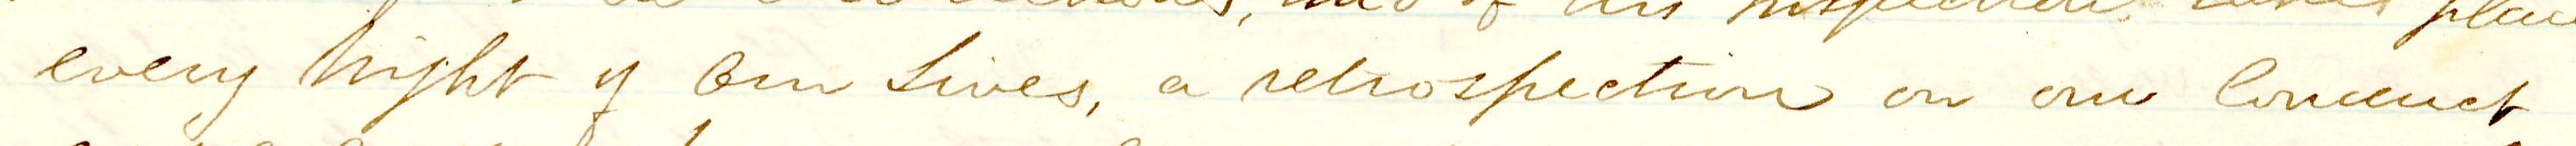every night if our lives, a retrospection on our Conduct
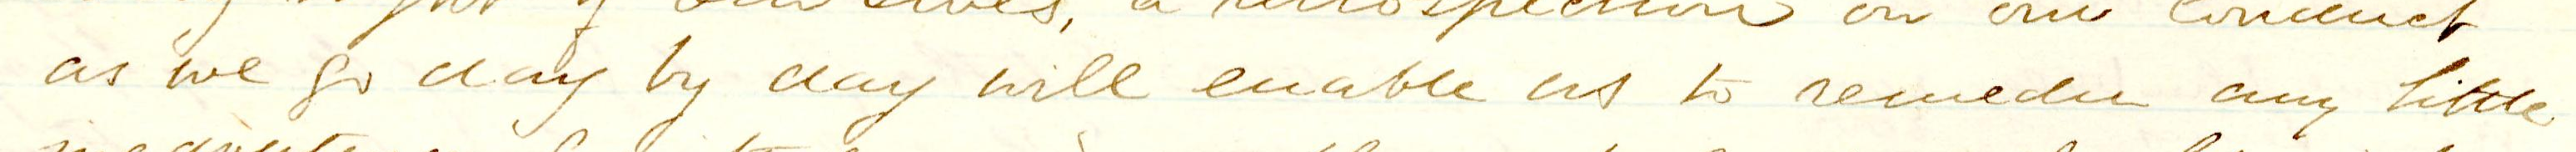as we go day by day will enable us to receive any little
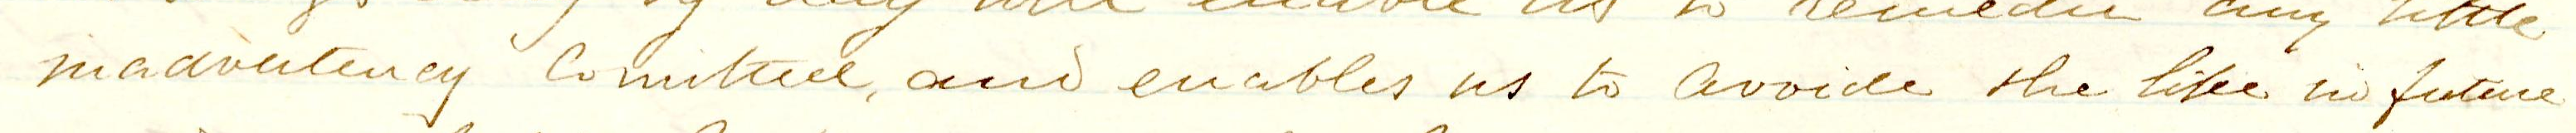inadvertency comitted, and enables us to avoide the like in future
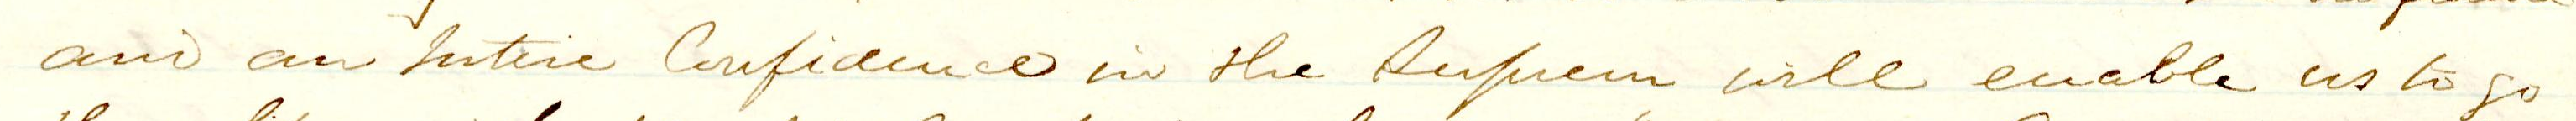and our Justice confidence in the Suprem will enable us to go
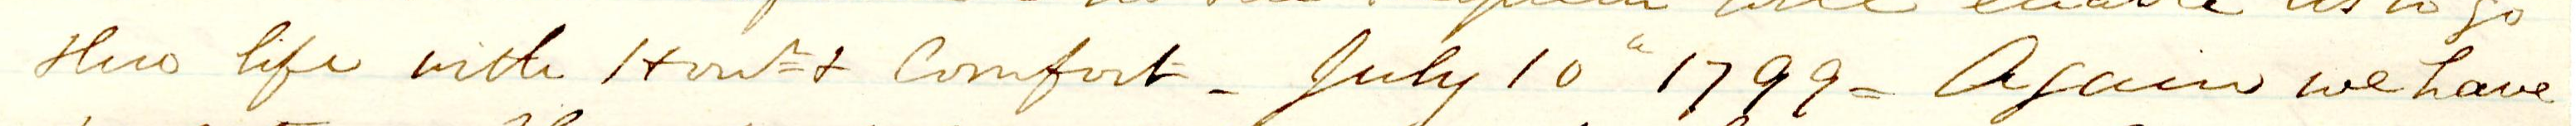there life with Hon^r & comfort.- July 10^th 1799- Again we have
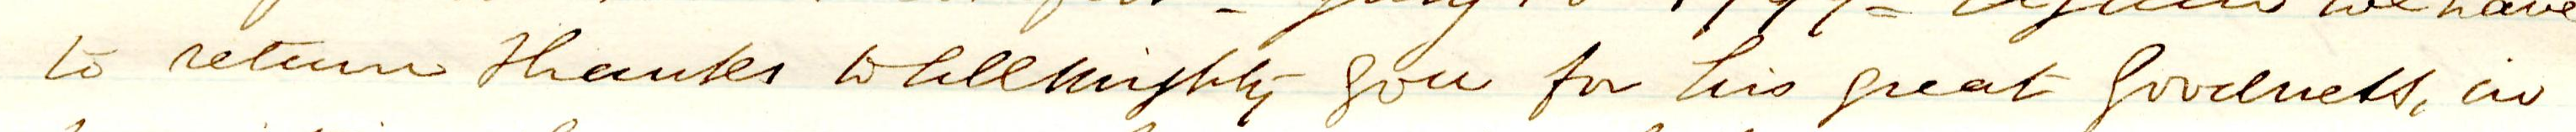to return thanks to almighty God for his great goodness, in
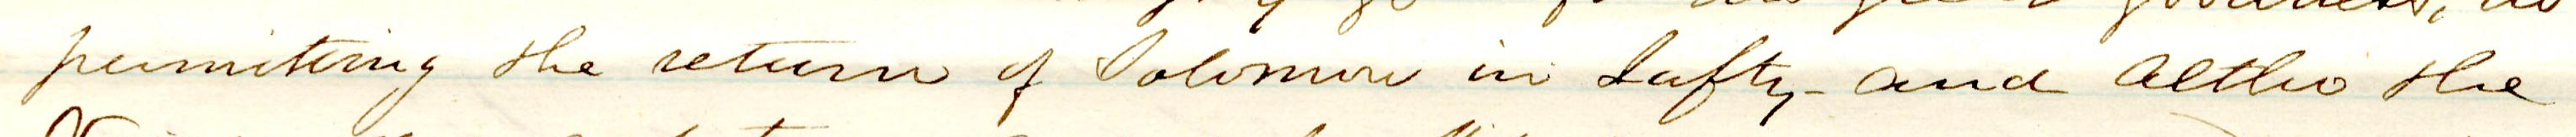permitting the return of Solomon in safty and altho the
